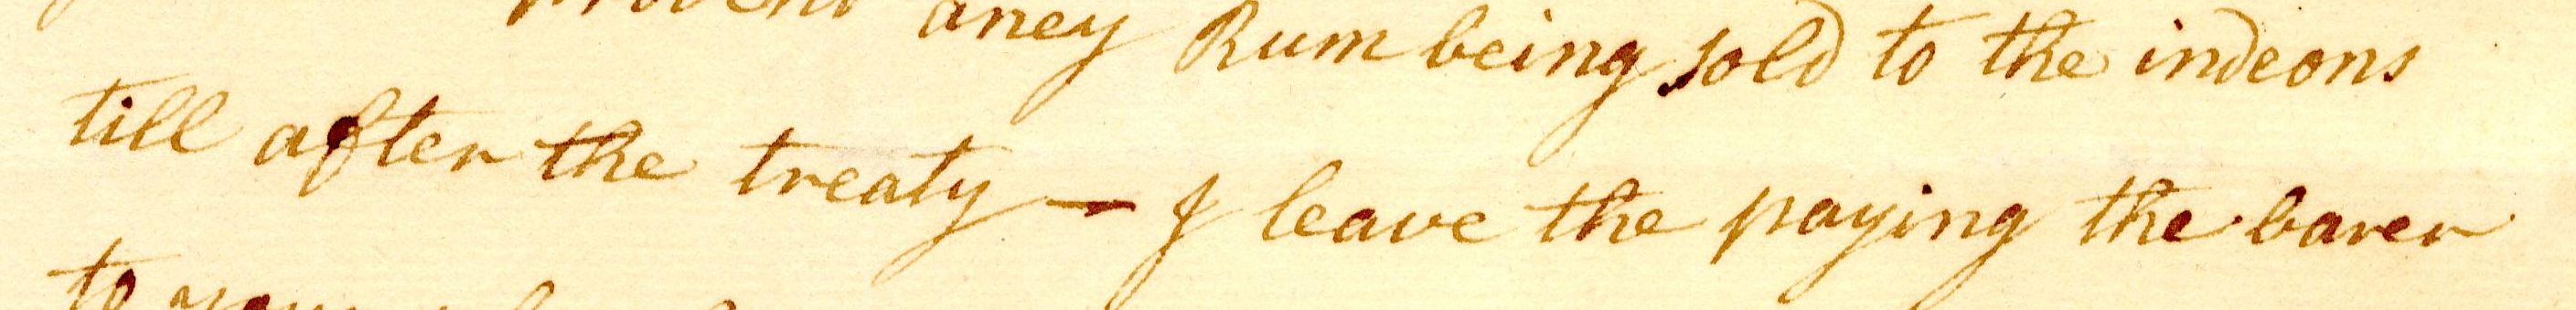till after the treaty- I leave the paying the barer
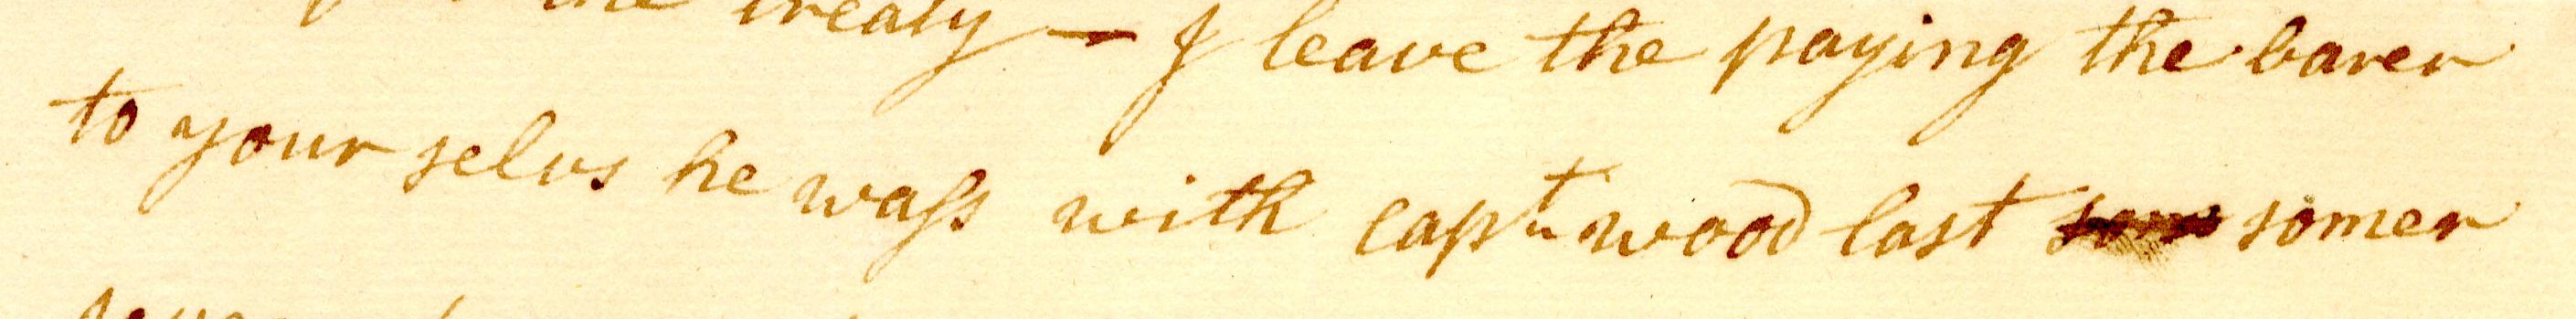to your selvs he wass with cap^t wood last [____] somer
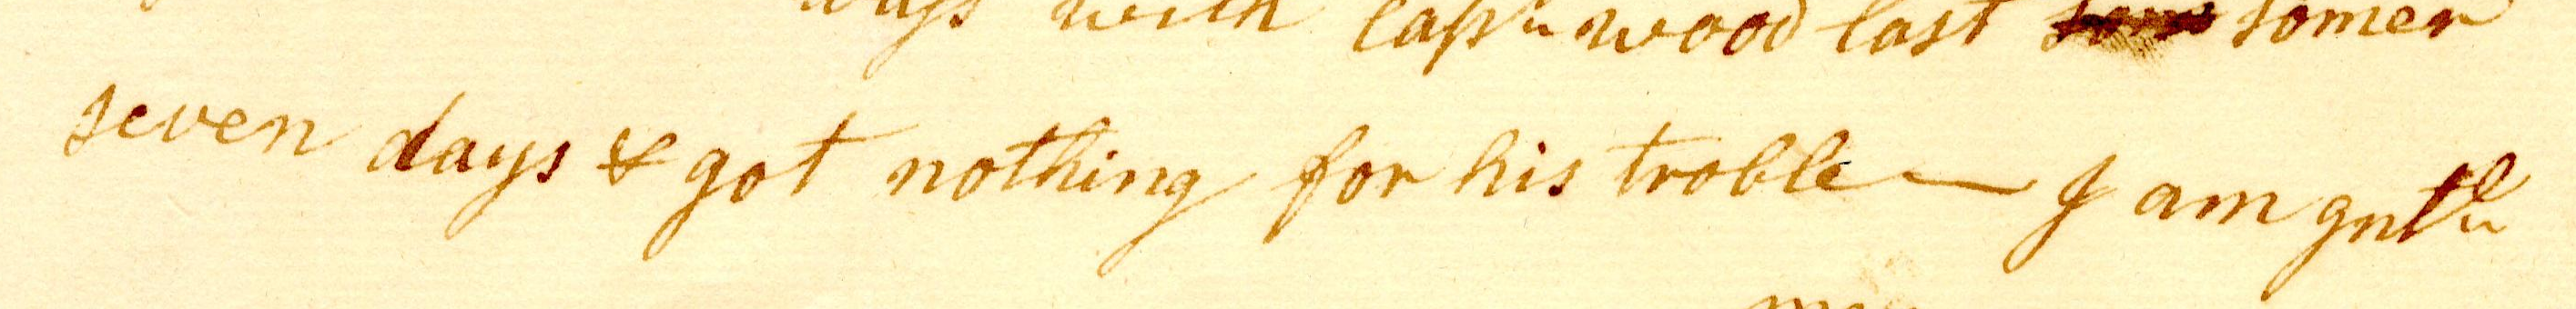seven days & got nothing for his troble- I am gnt^e-
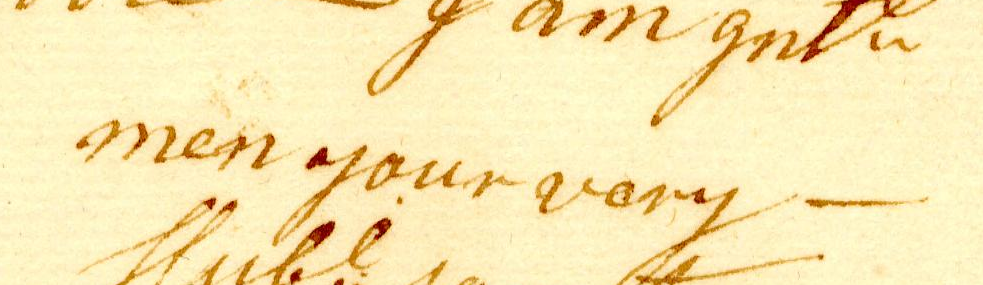men your very-
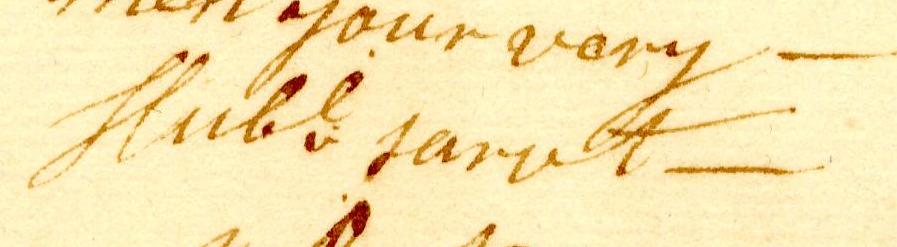Hub^l. sarvt-
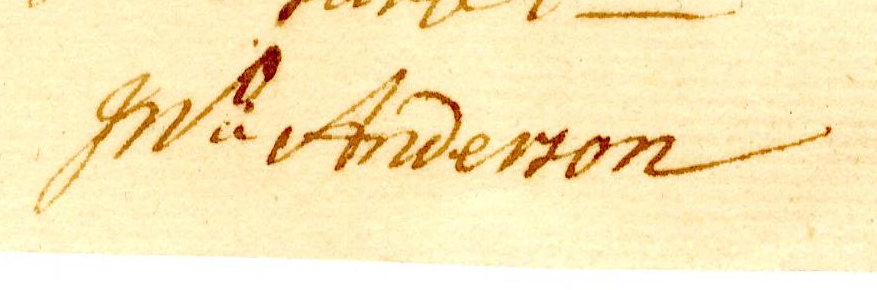M^r Anderson
